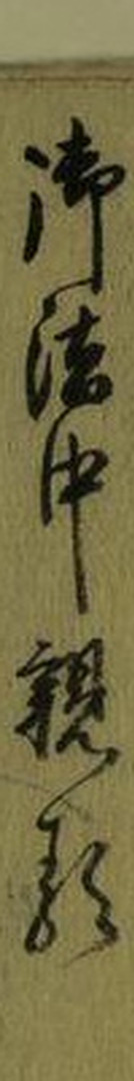御法中親類
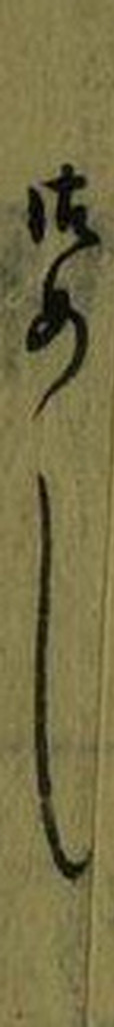御めし
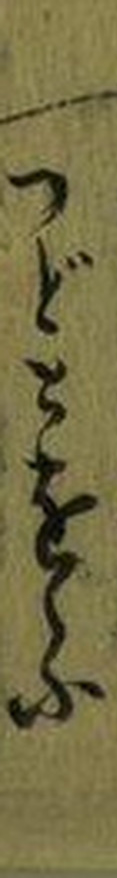つどとをふ
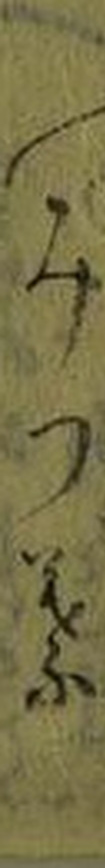みつ葉
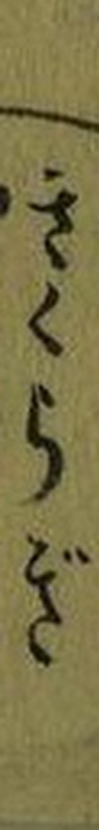坪きくらぎ
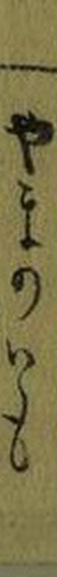やまのいも
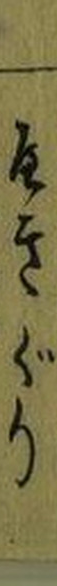やきぐり
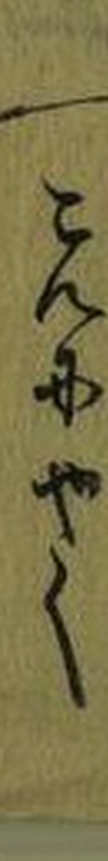こんにやく
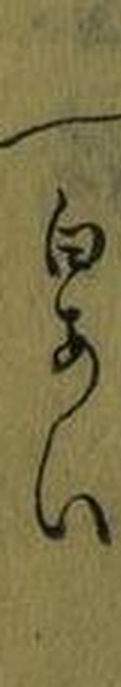白あい
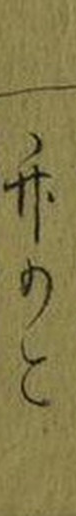竹のこ
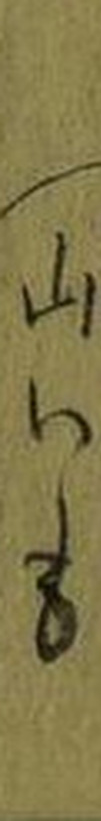山いも

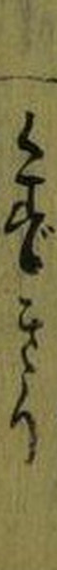くずきり
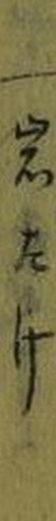岩たけ
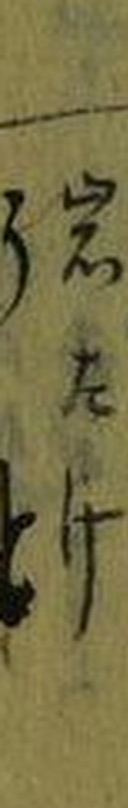岩たけ
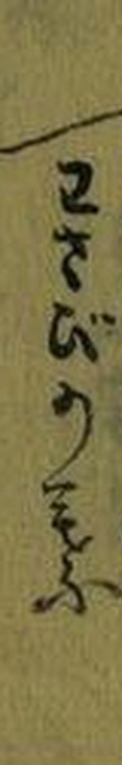わさびの葉
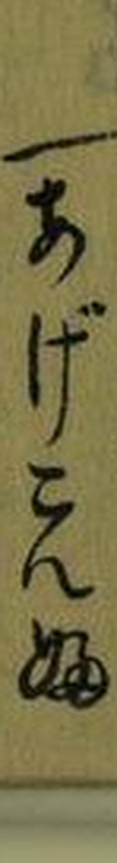あげこんふ
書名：（献立覚）
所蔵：福井県文書館 Fukui Prefectural Archives
